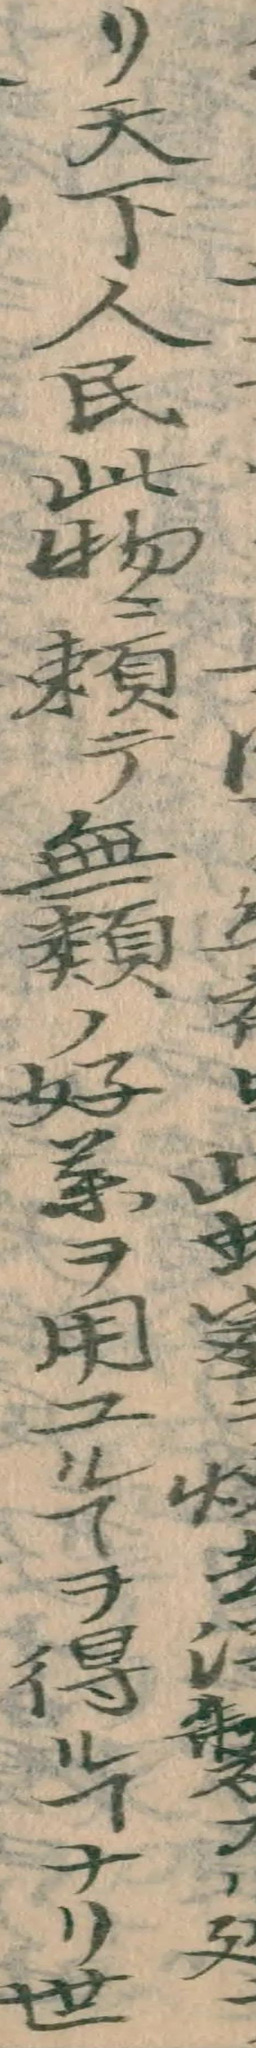リ天下人民此物ニ頼テ無類ノ好薬ヲ用ユルコトヲ得ルコトナリ世
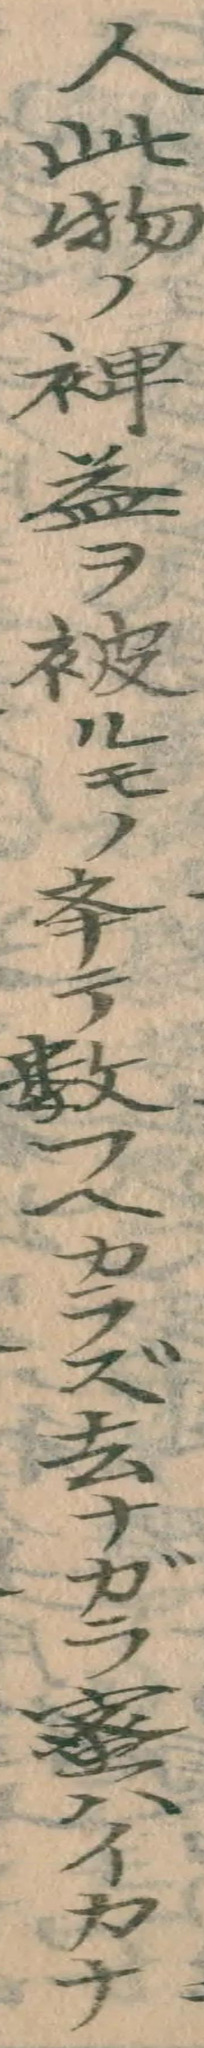人此物ノ裨益ヲ被ルモノ挙テ數フヘカラズ去ナガラ蜜ハイカナ
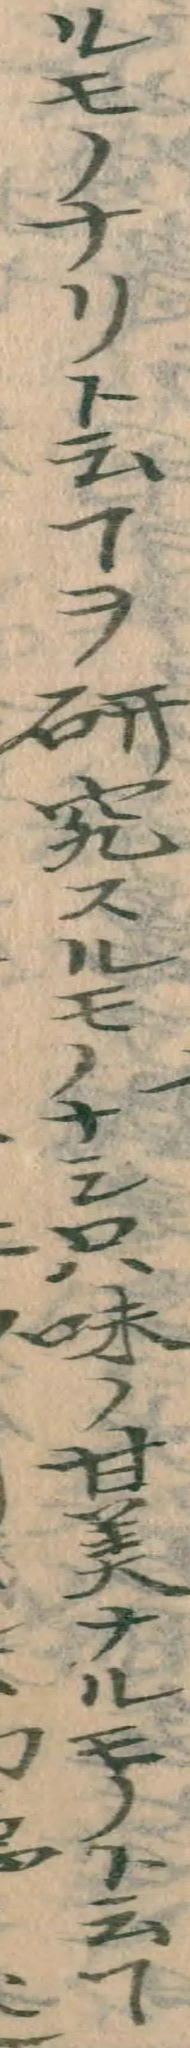ルモノナリト云コトヲ研究スルモノナシ只味ノ甘美ナルモノト云コト
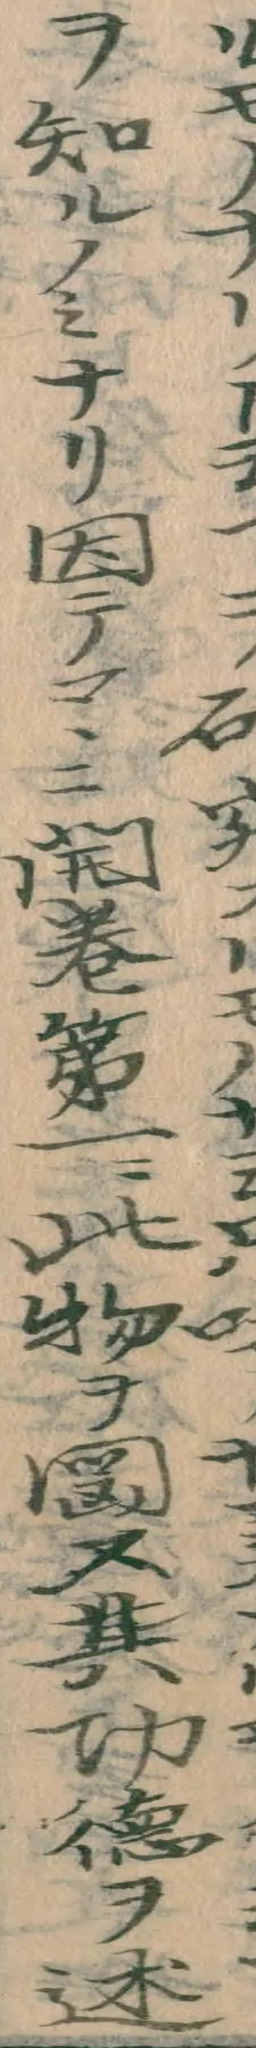ヲ知ルノミナリ因テコヽニ開巻第一ニ此物ヲ圖ス其功徳ヲ述
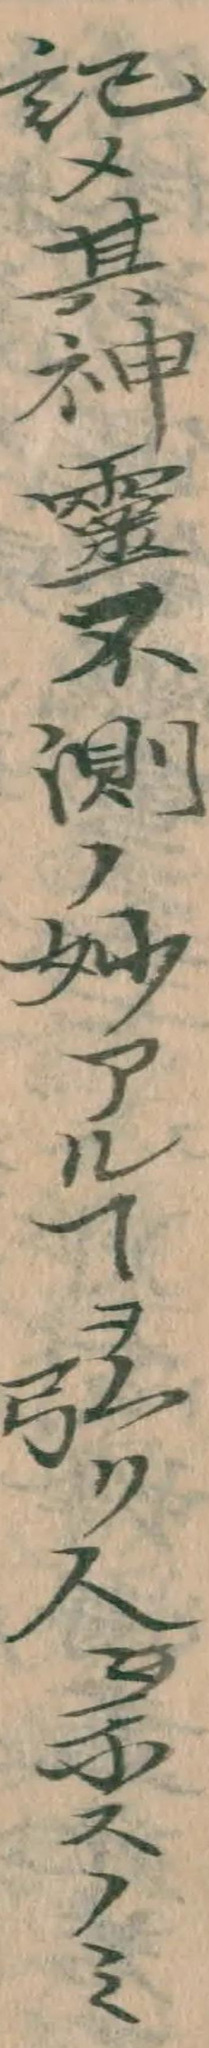記シテ其神霊不測ノ妙アルコトヲ弘ク人ニ示スノミ
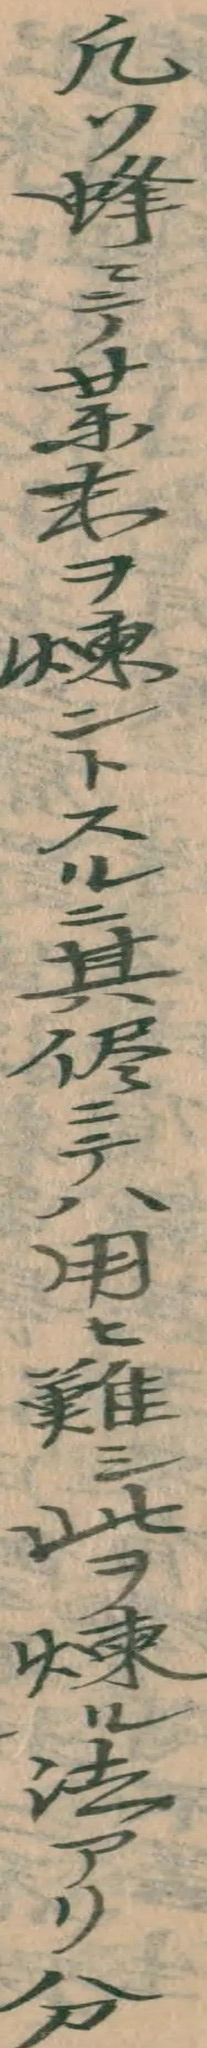凡ソ蜂ニテ薬末ヲ煉ントスルニ其侭ニテハ用ヒ難シ此ヲ煉ル法アリ分
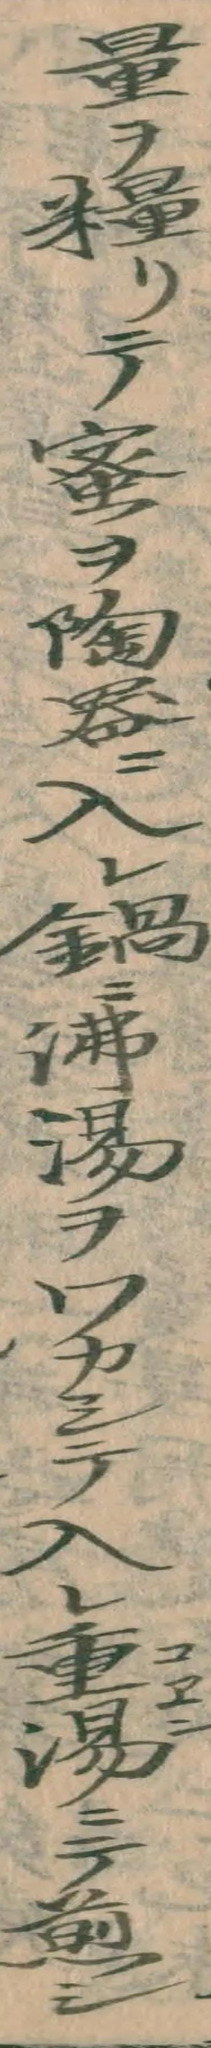量ヲ糧リテ蜜ヲ陶器ニ入レ鍋ニ沸湯ヲワカシテ入レ重湯ニテ煎シ
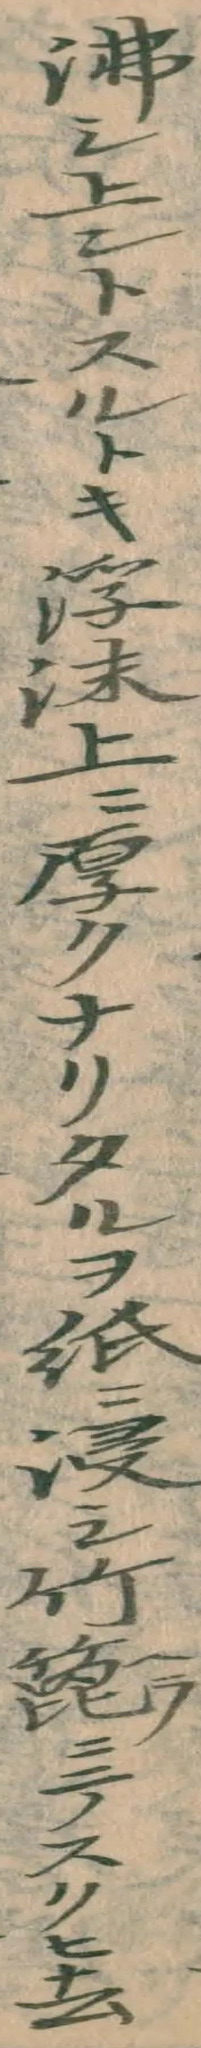沸シ上ントスルトキ浮沫上ニ厚クナリタルヲ紙ニ浸シ竹箆ニテスクヒ去
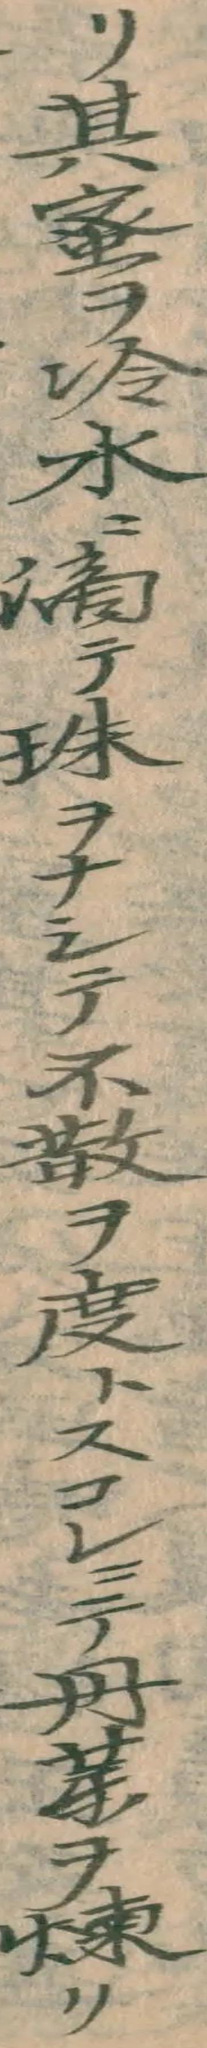リ其蜜ヲ冷水ニ滴テ珠ヲナシテ不散ヲ度トスコレニテ丹薬ヲ煉リ
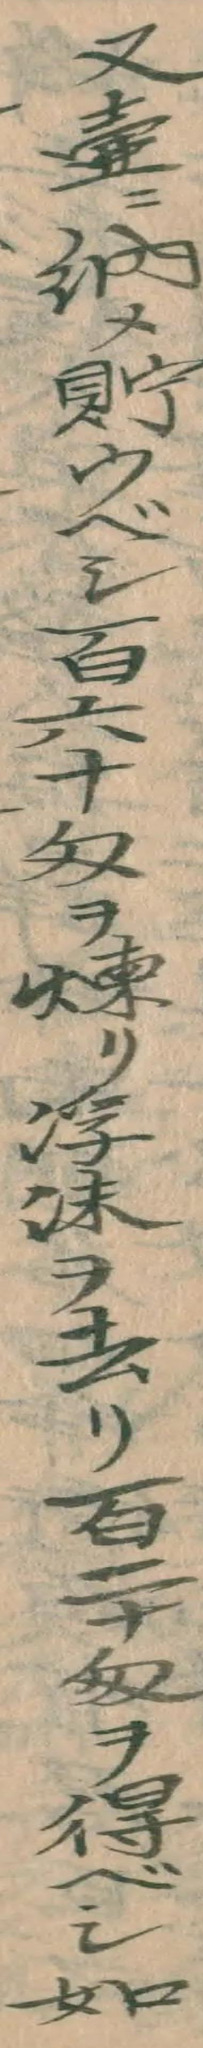又壷ニ納メ貯ウベシ百六十匁ヲ煉リ浮沫ヲ去リ百二十匁ヲ得ベシ如
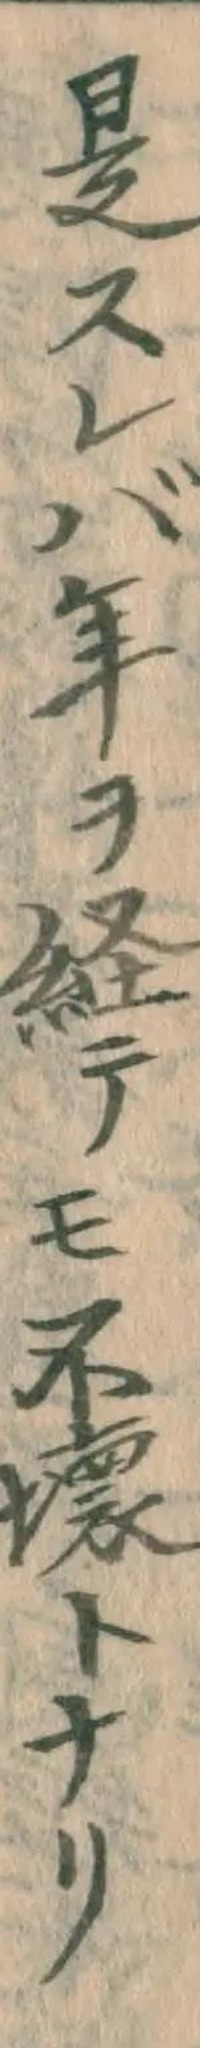是スレバ年ヲ経テモ不壊トナリ
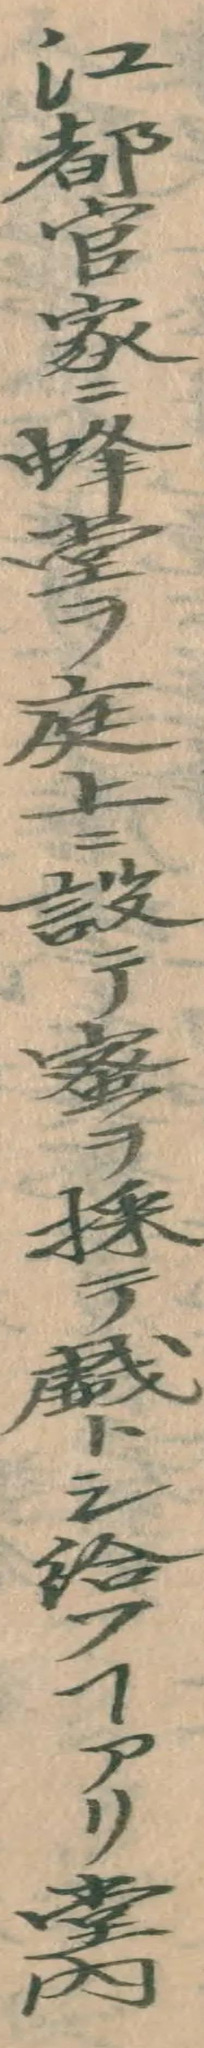江都官家ニ蜂堂ヲ庭上ニ設テ蜜ヲ採テ戯トシ給フコトアリ堂内
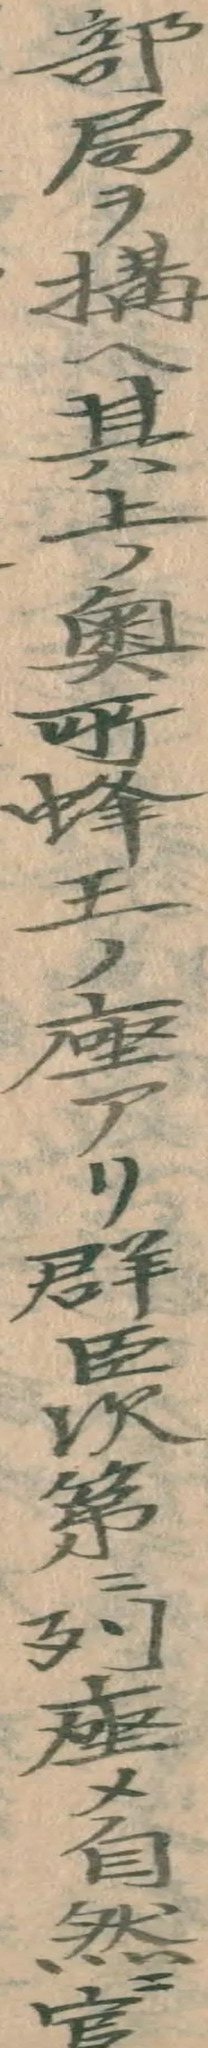部局ヲ搆ヘ其上ノ奥所蜂王ノ座アリ群臣次第ニ列座シテ自然ニ官
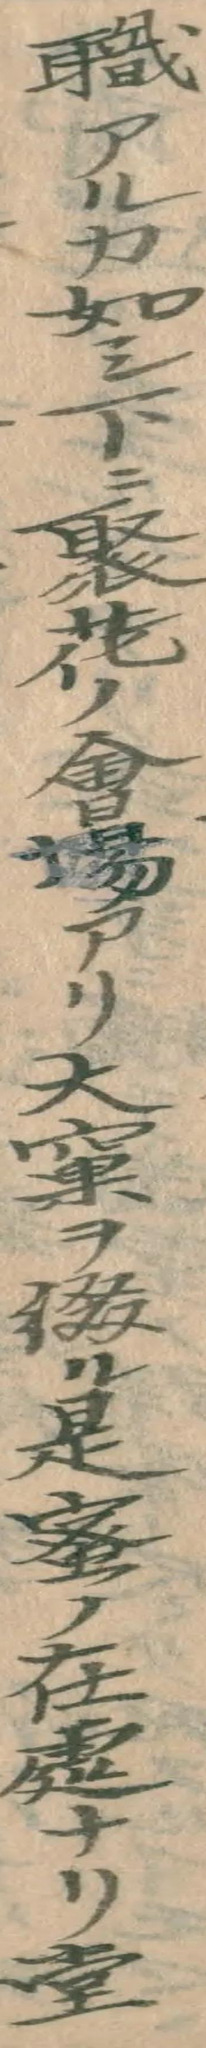職アルカ如シ下ニ聚花ノ會場アリ大窠ヲ綴ル是蜜ノ在處ナリ堂
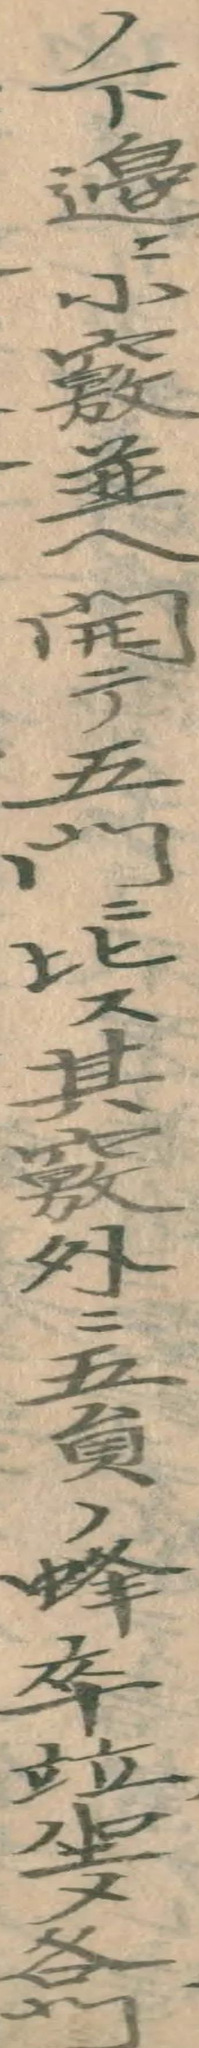ノ下邉ニ小竅並ヘ開テ五門ニ比ス其竅外ニ五貟ノ蜂卒竝坐シテ各門
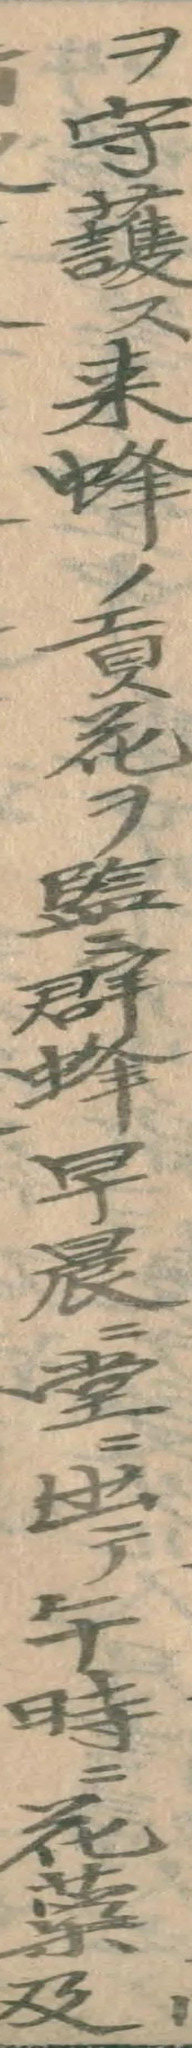ヲ守護ス来蜂ノ貢花ヲ監ス群蜂早晨ニ堂ニ出テ午時ニ花蘂及
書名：千蟲譜 3巻. [1]
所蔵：国立国会図書館 National Diet Library, JAPAN
